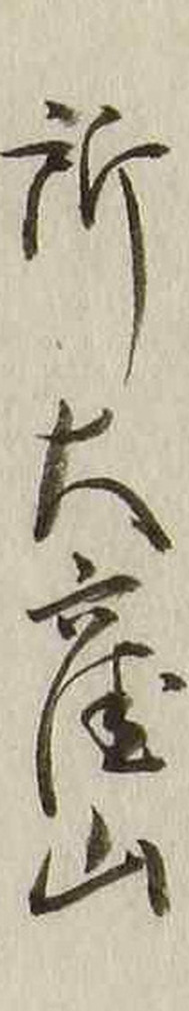所大窪山
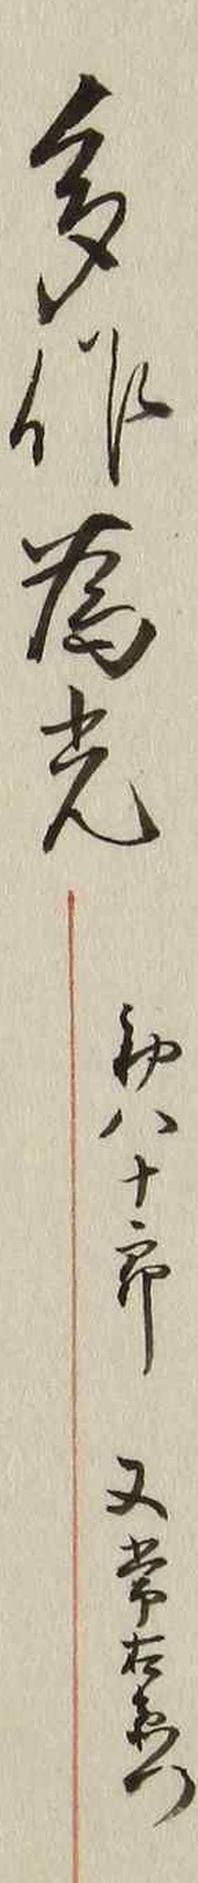多作為光初八十郎又常右衛門
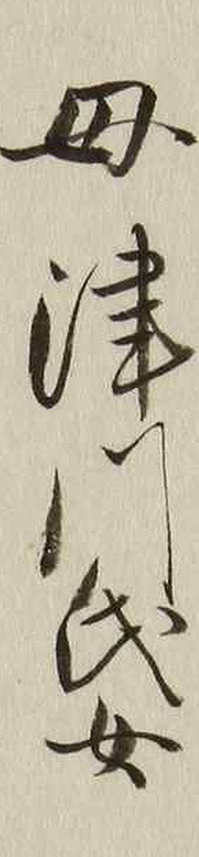母津川氏女
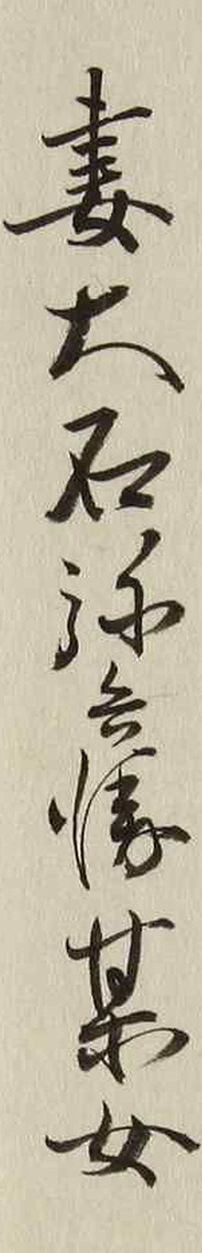妻大石弥兵衛某女
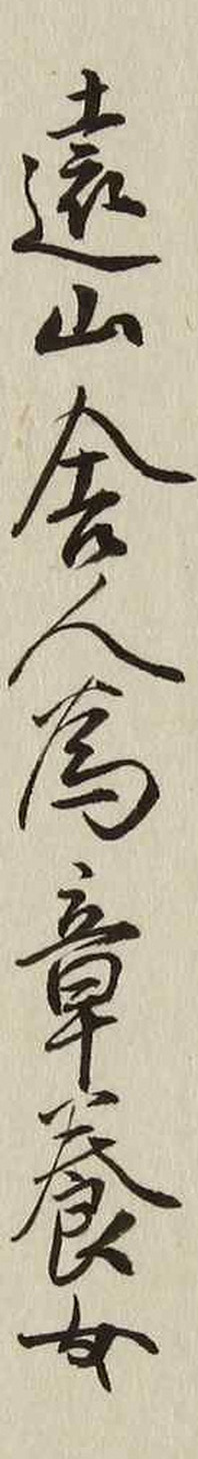遠山舎人為章養女
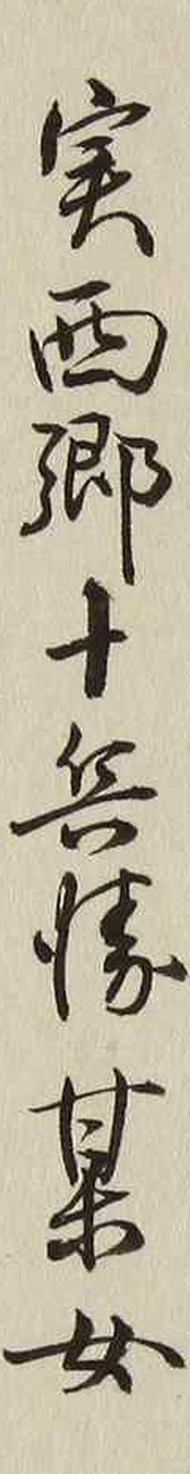実西郷十兵衛某女
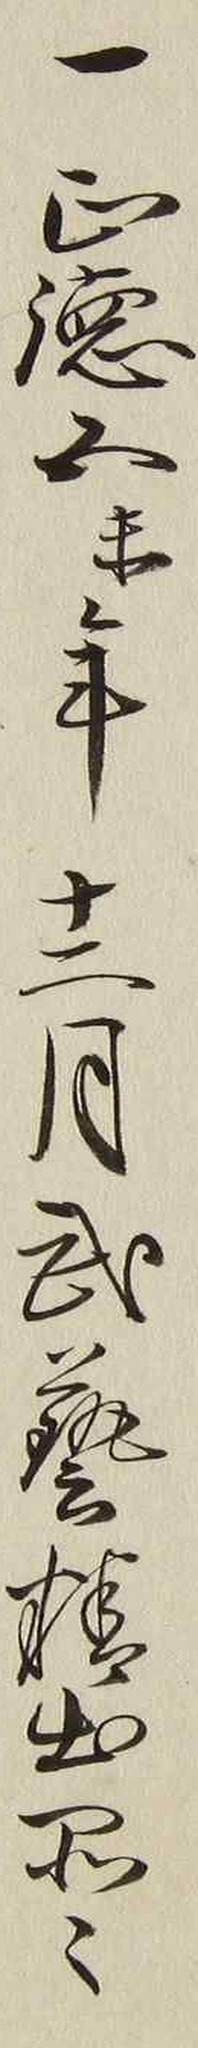一正徳五未年十二月武芸精出品々
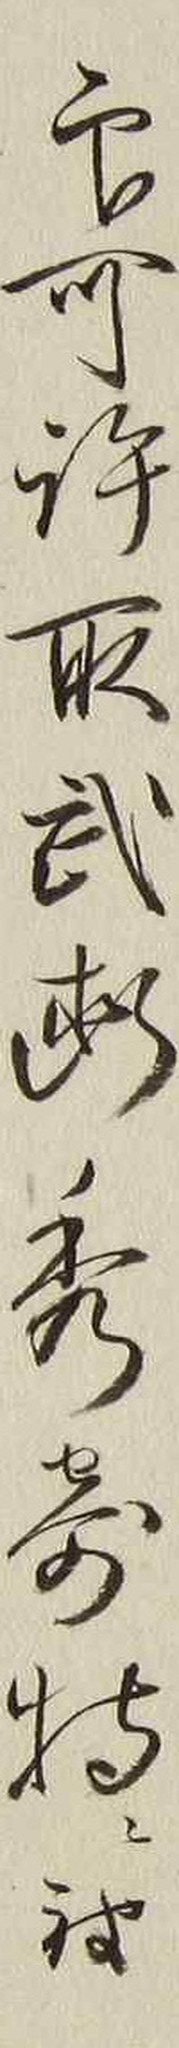印可許取武術秀寄特ニ被
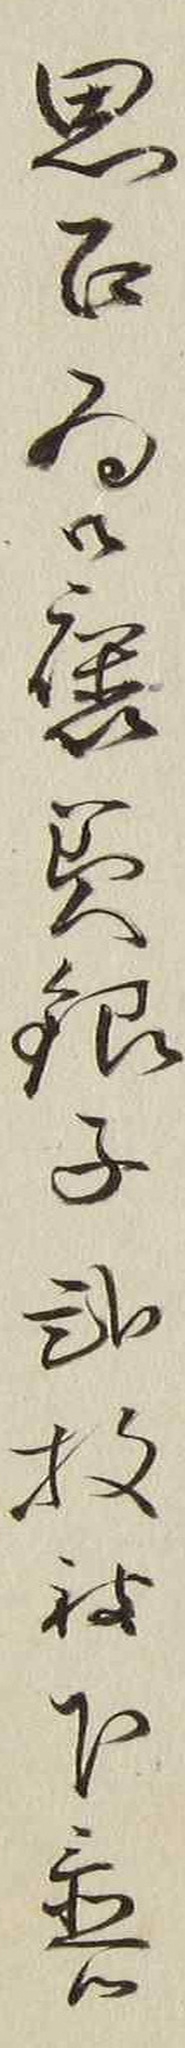思召為御褒美銀子弐枚被下置候
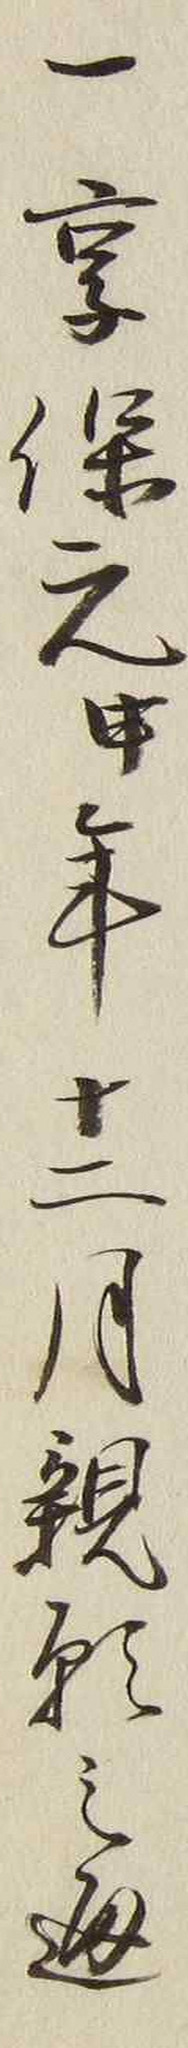一享保元申年十二月親願之通

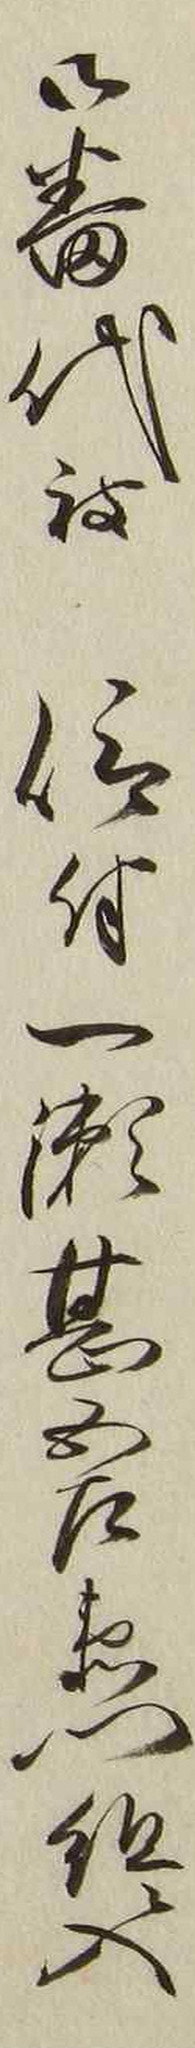御番代被仰付一瀬甚五右衛門組ニ入
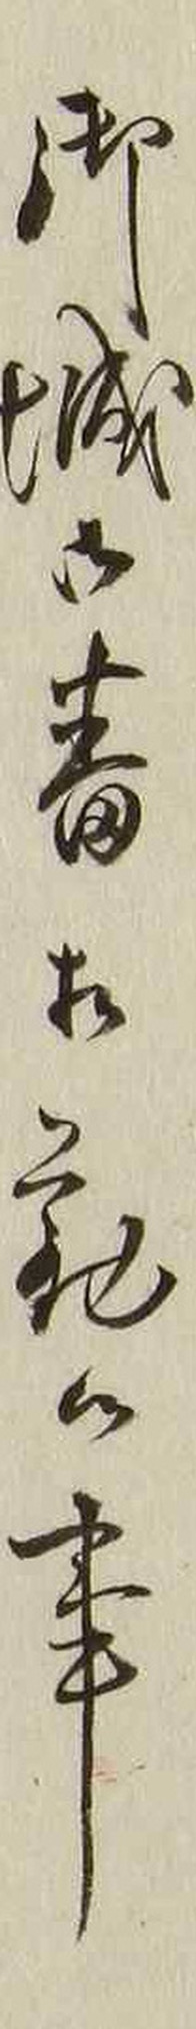御城御番相勤候事
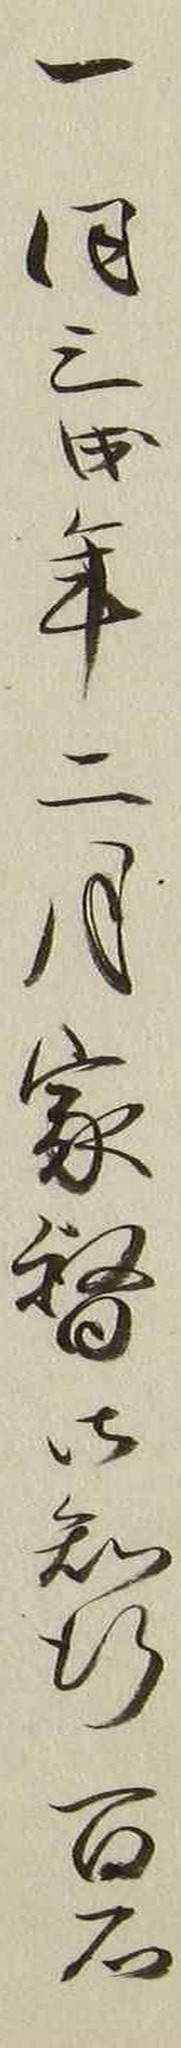一同三戌年二月家督御知行百石
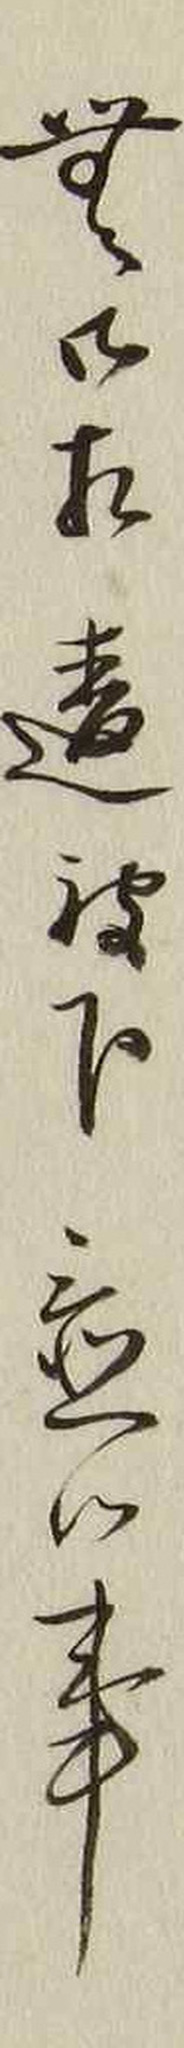無御相違被下置候事
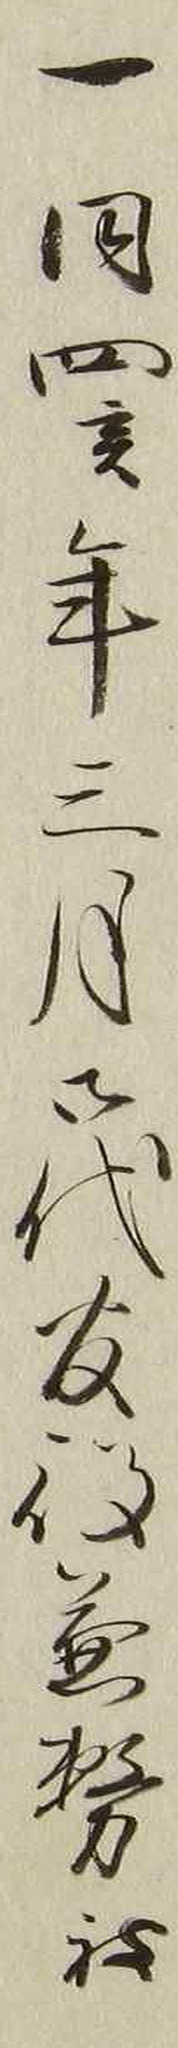一同四亥年三月御代官役兼務被
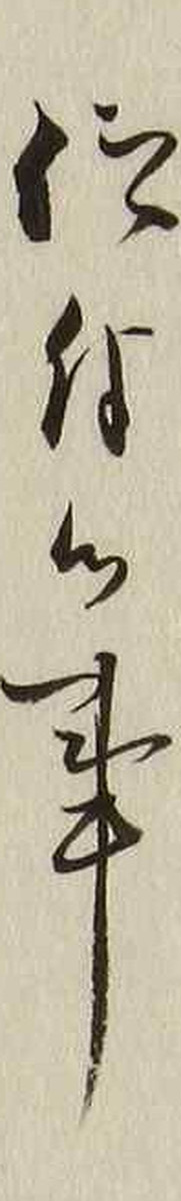仰付候事
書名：諸士系譜　巻之163　な之部5
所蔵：会津若松市立会津図書館
